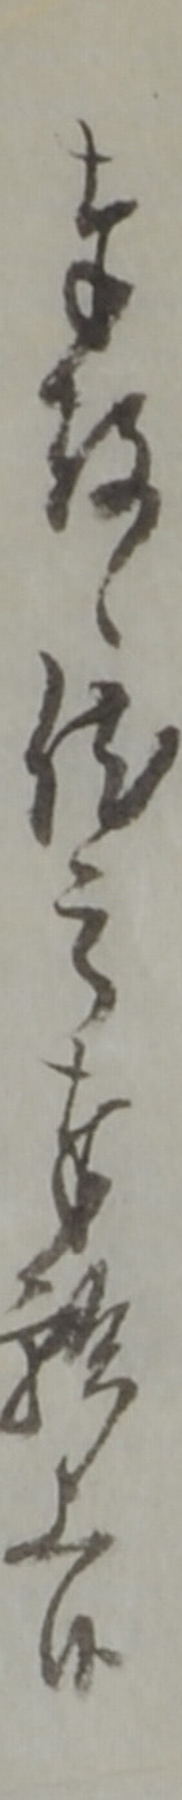奉存候依之奉願上候
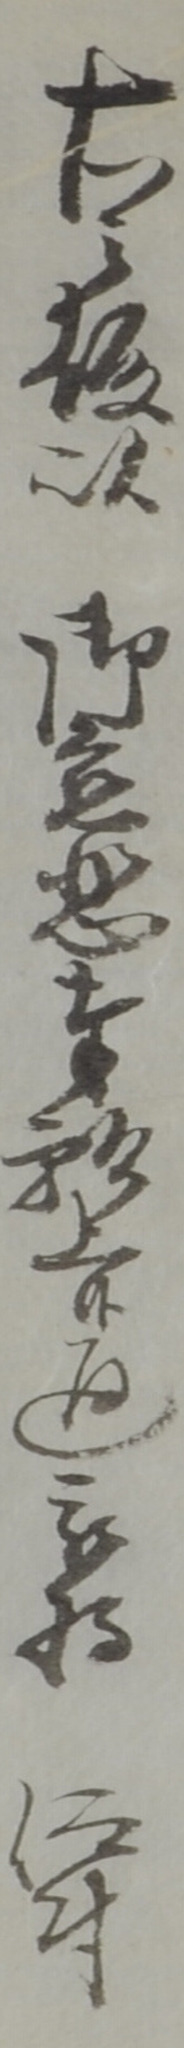右之趣以御慈悲奉願上候通被為仰付
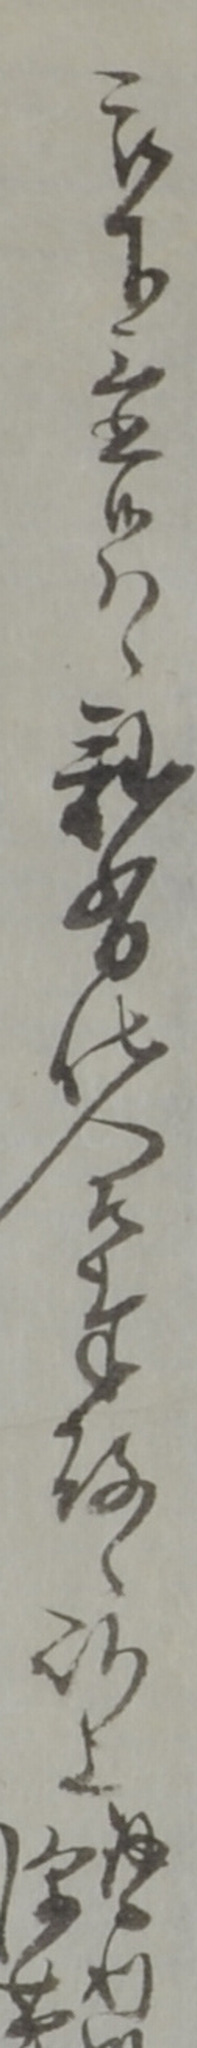被下置候ハヽ難有仕合奉存候以上
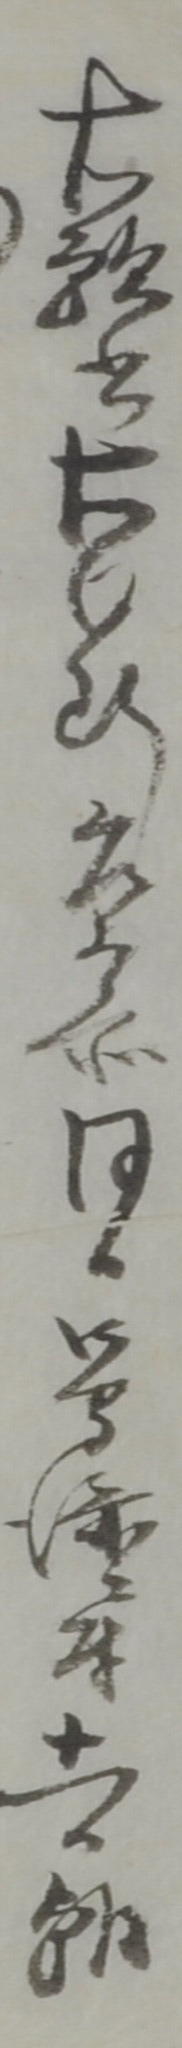右願書右同断差上候所同日御聞済ニ付十一日朝
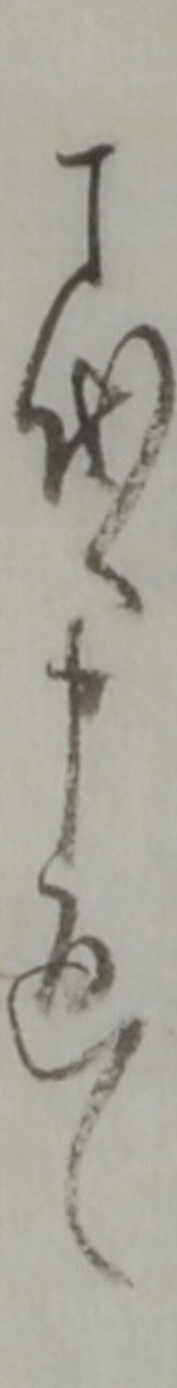町代へ申通候

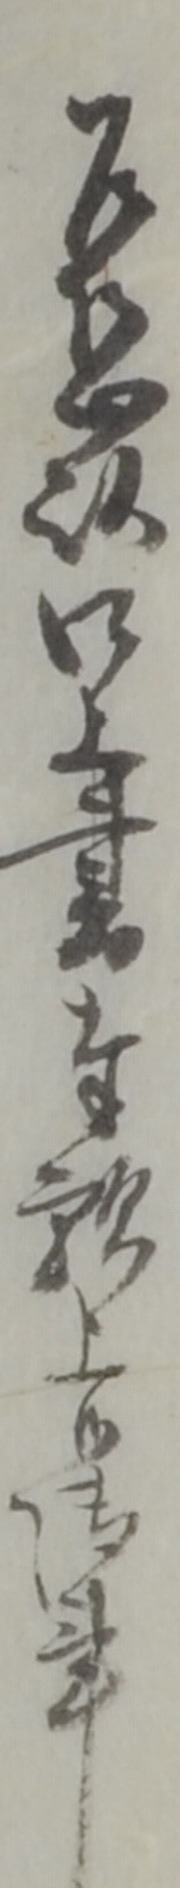乍恐以口上書奉願上候御事
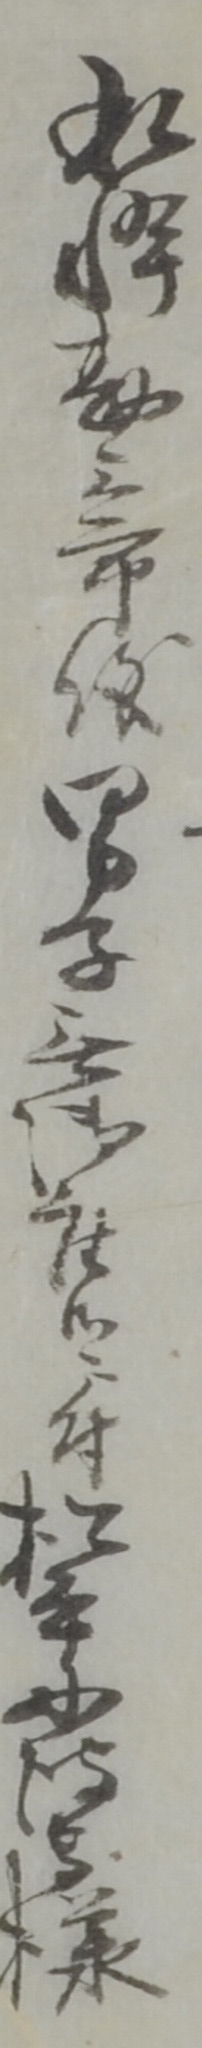私忰勘三郎儀男子無御座候ニ付松平丹波守様
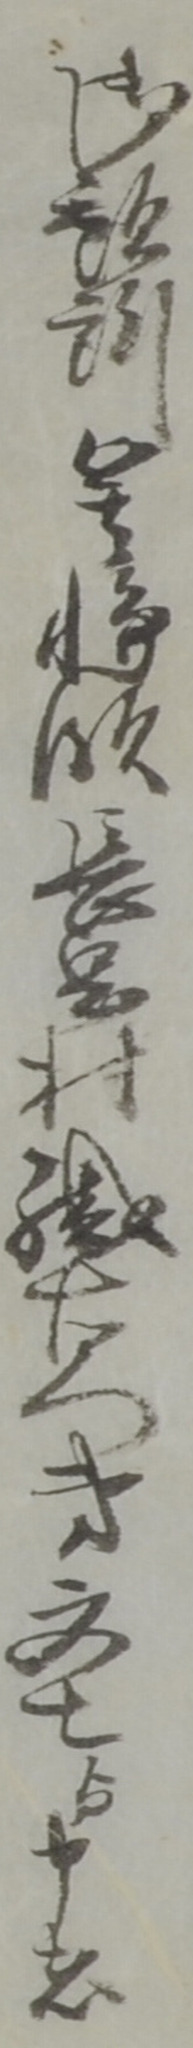御預所箕輪領長岡村織右衛門弟文七与申者
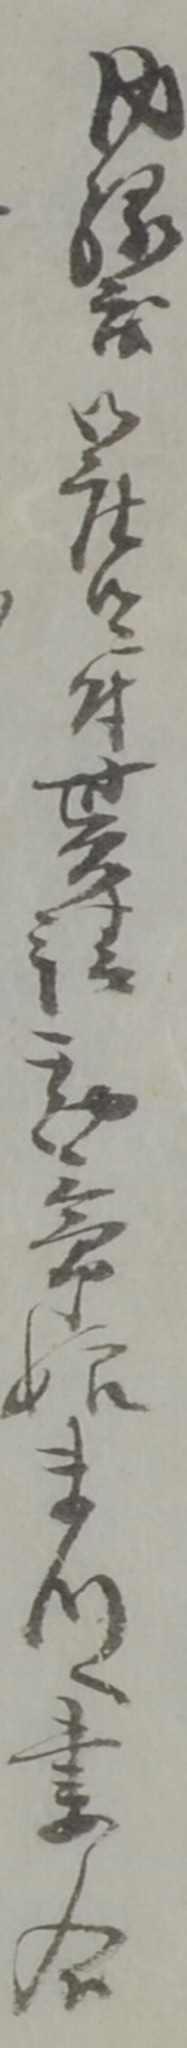内縁も御座候ニ付貰請勘三郎娘ま川へ妻合
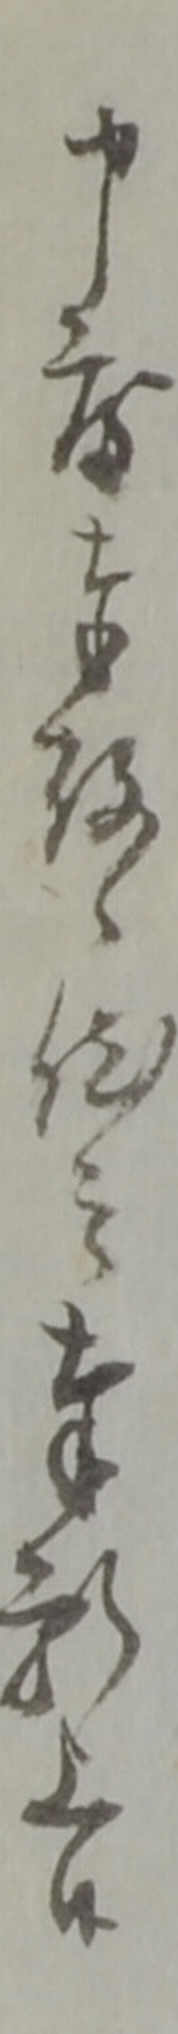申度奉存候依之奉願上候
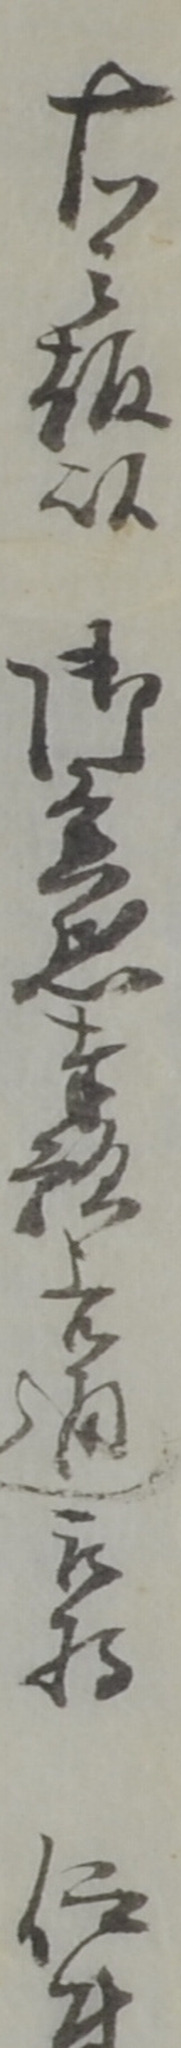右之趣以御慈悲奉願上候通被為仰付
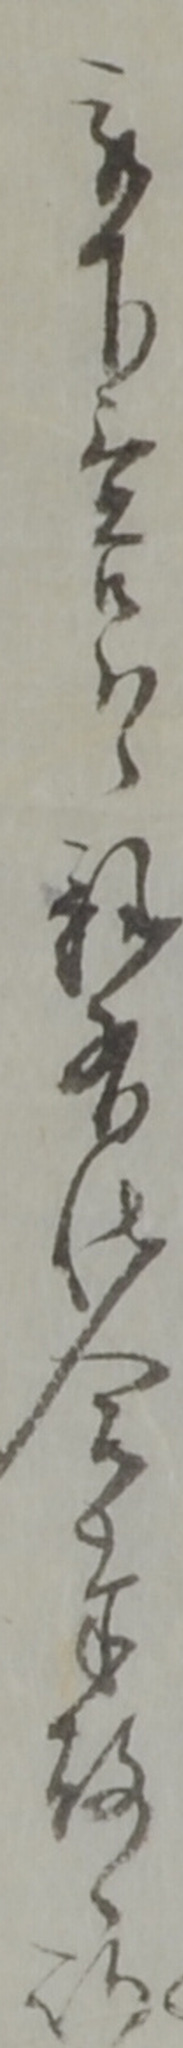被下置候ハヽ難有仕合奉存候以上
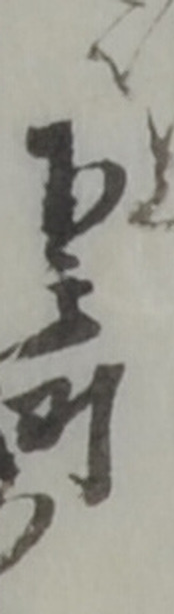下モ町
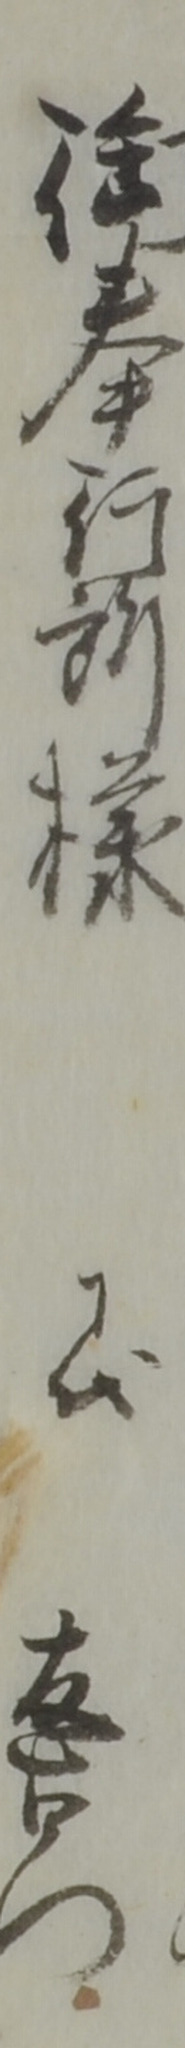御奉行所様丁代藤右衛門
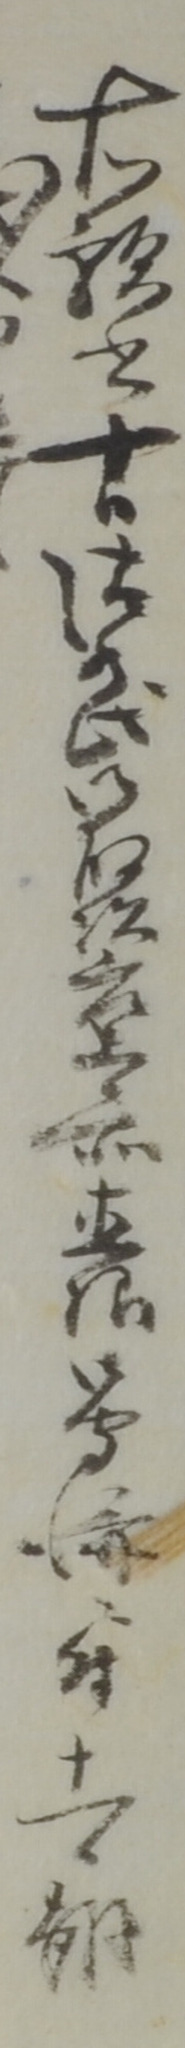右願書十日清水氏御取次差上候所直様御聞済ニ付十一日朝
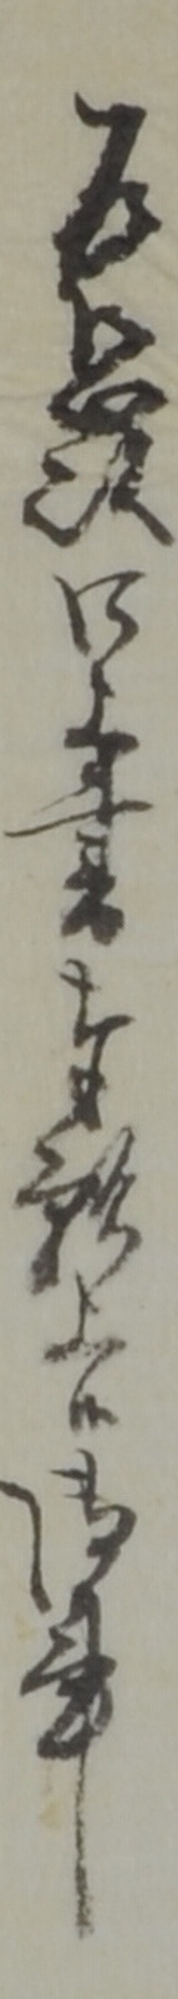乍恐以口上書奉願上候御事
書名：諸願書控簿
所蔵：伊那市立高遠町図書館・合同会社AMANE
